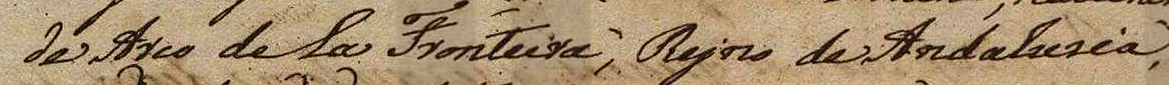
de Arco de La Fronteira, Rejno de Andaluzia,
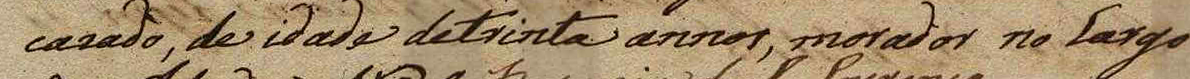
cazado, de idade de trinta annos, morador no Largo
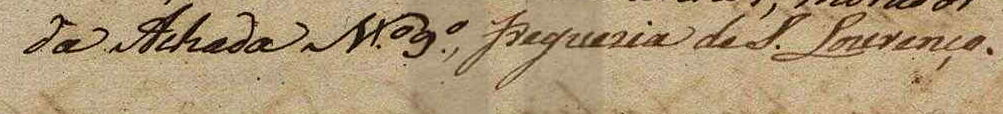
da Achada N.o 9.o, freguezia de S. Lourenço.
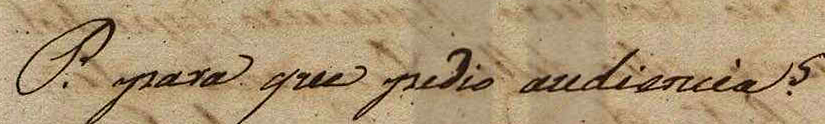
P. para que pedio audiencia?
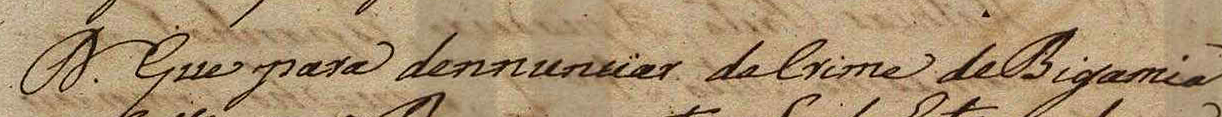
D. Que para dennunciar do Crime de Bigamia
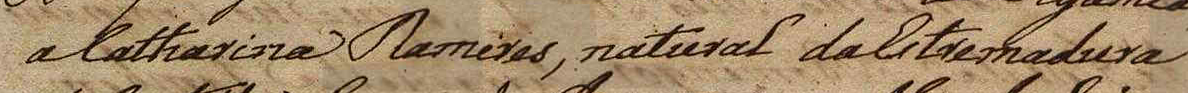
a Catharina Ramires, natural da Estremadura
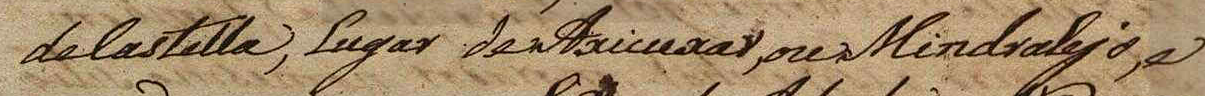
de Castella, Lugar de Axicuxar, ou Mindrahejo, e
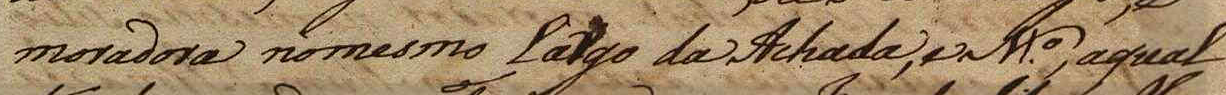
moradora no mesmo Largo da Achada, e N.o, a qual
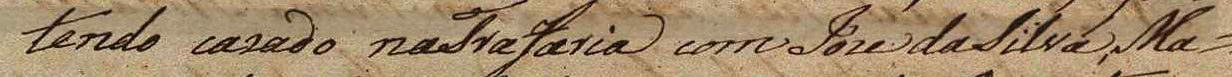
tendo cazado na Trafaria com Ioze da Silva, Ma
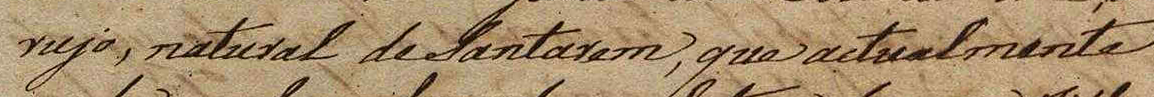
rujo, natural de Santarem, que actualmente
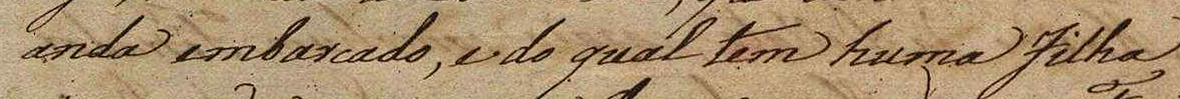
anda embarcado, e do qual tem huma filha
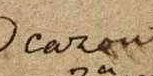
cazou
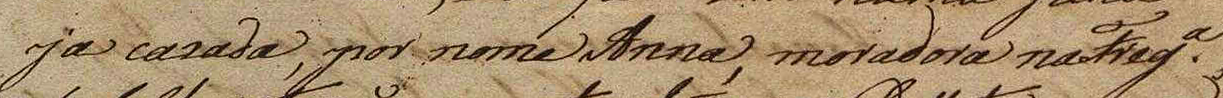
ja cazada, por nome Anna, moradora na Freg.a
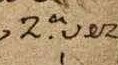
2.a vez
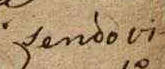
sendo vi
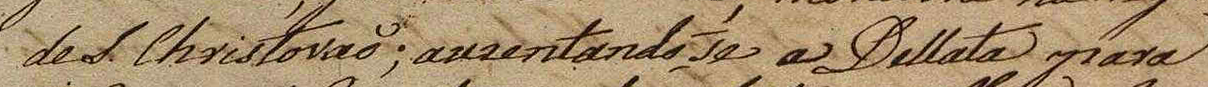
de S. Christovaõ; auzentando-se a Dellata para
